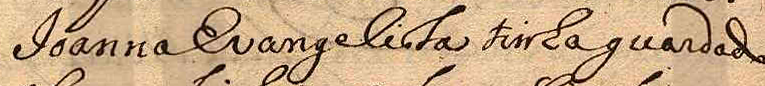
Ioanna Evangelista tinha guardado
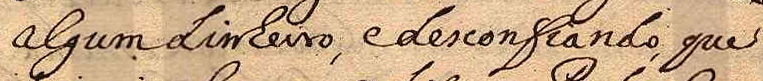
algum dinheiro, e desconfiando, que
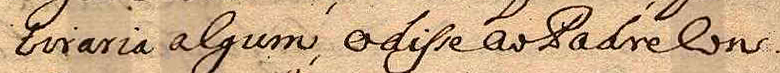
tiraria algum, o disse ao Padre Con
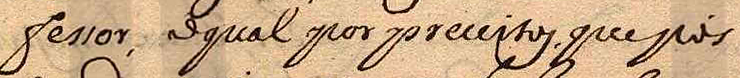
fessor, o qual por preceitos, que pós
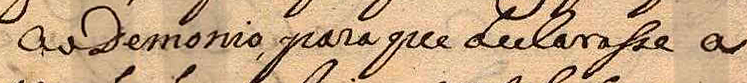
ao Demonio, para que declarasse a
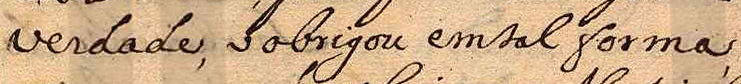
verdade, o obrigou em tal forma,
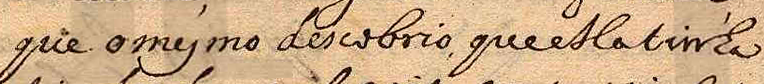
que o mesmo descobrio, que ella tinha
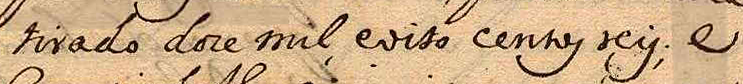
tirado doze mil, e oitocentos reis; e
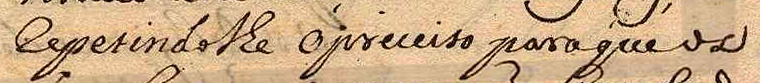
Repetindolhe o preceito para que oz
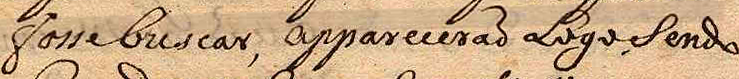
fosse buscar, appareceraõ Logo sendo
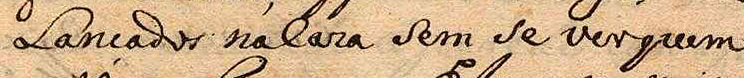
Lançados na caza sem se ver quem
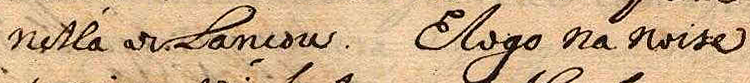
nella os Lançou. E logo na noite
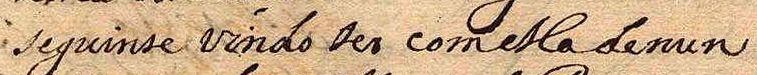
seguinte vindo ter com ella denun
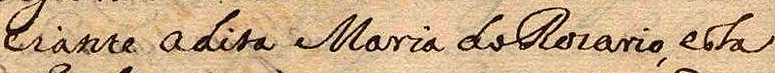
ciante a dita Maria do Rozario, esta
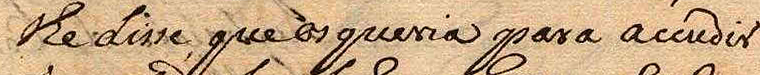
lhe disse, que os queria para accudir
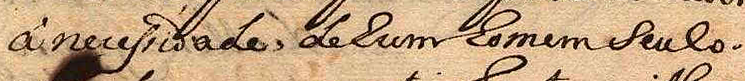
á necessidade de hum homem seu Co
